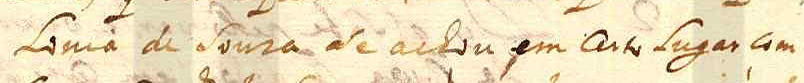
Lonia de souza se achou em certo Lugar com
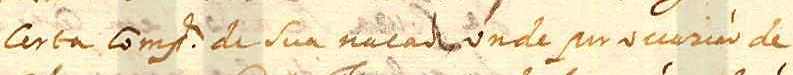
certa comp.a de sua naçaõ onde por occaziaõ de
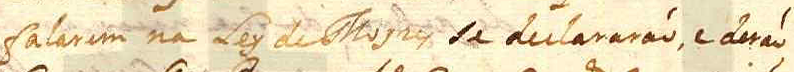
falarem na Ley de Moyzes se declararaõ, e deraõ
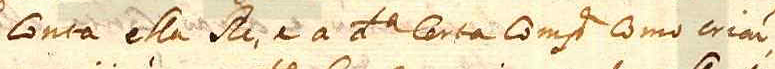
conta ella Re, e a d̄a certa Compa como criaõ,
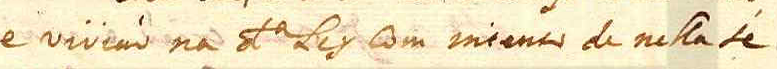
e viviaõ na d̄a Ley com intento de nella se
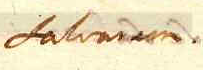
salvarem.
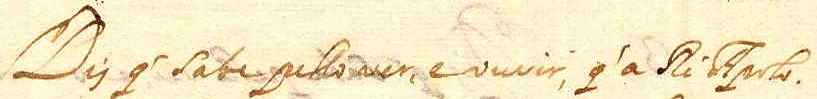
Dis q̄ sabe pello ver, e ouvir, q̄ a Ré Apolo
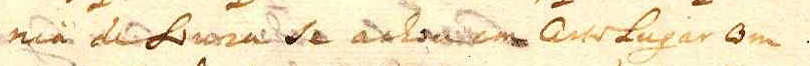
nia de souza se achou em certo Lugar com
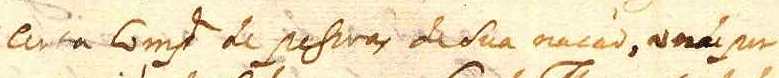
certa compa de pessoas de sua naçaõ, onde por
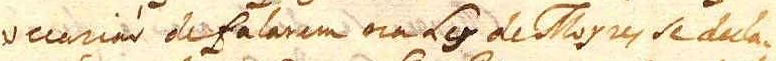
occaziaõ de falarem na Ley de Moyzes se decla
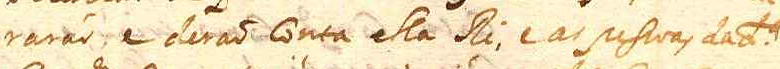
raraõ, e deraõ conta ella Ré, e as pessoas da d̄.a
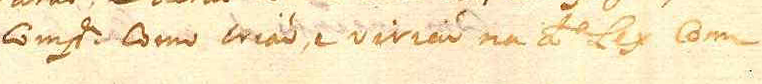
comp.a como criaõ, e viviaõ na d̄a Ley com
